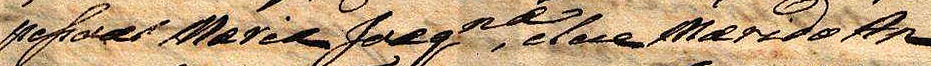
pessoas Maria Joaqna, e seu Marido An
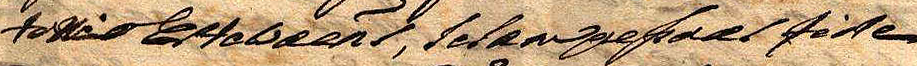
tonio Estevaeñs, se sam pessoas fide
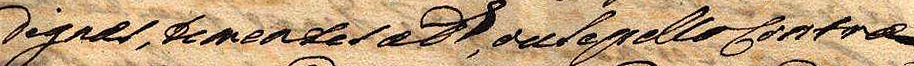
dignas, tementes a Ds, ou se pello Contra
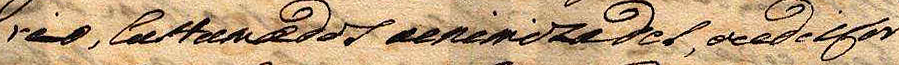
rio, Custumados a enimizades, ou disCor
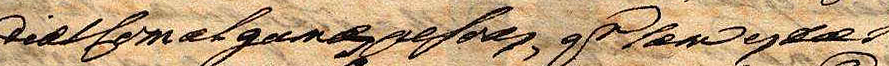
dias Com algumas pesoas, qn sam estas
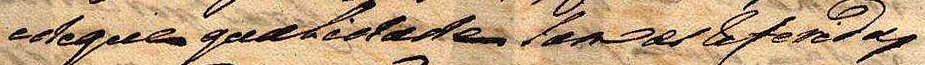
e de que qualidade sam as Referidas
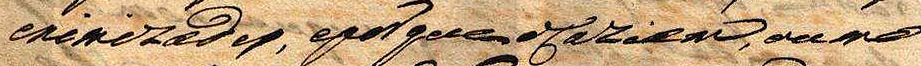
enimizades, e porque oCaziam, ou mo
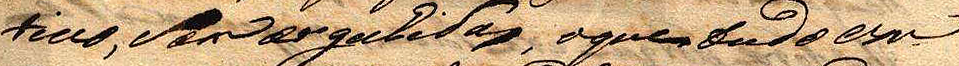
tivo, sam arguhidas, o que tudo vm
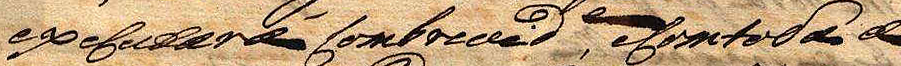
exeCutará Com brevide, e Com toda a
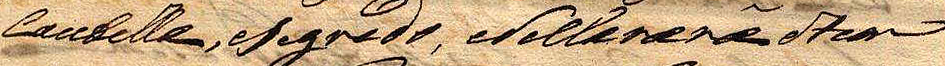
Cautella, e segredo, e declarará o tem
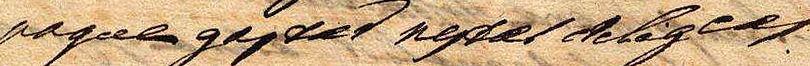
po que gastar nestas deligcas.
